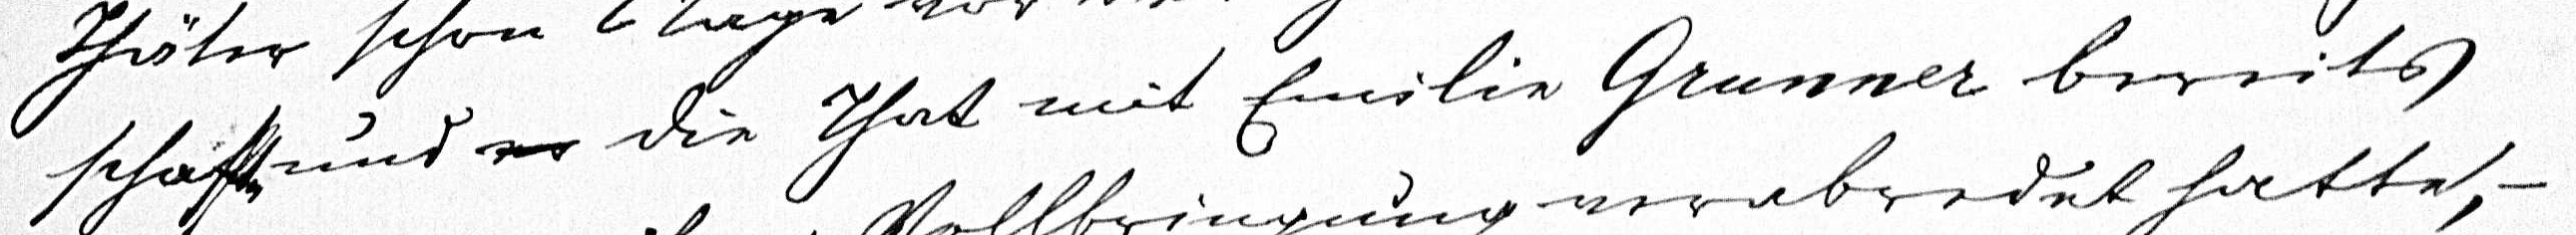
schafft und die That mit Emilie Grunner bereits
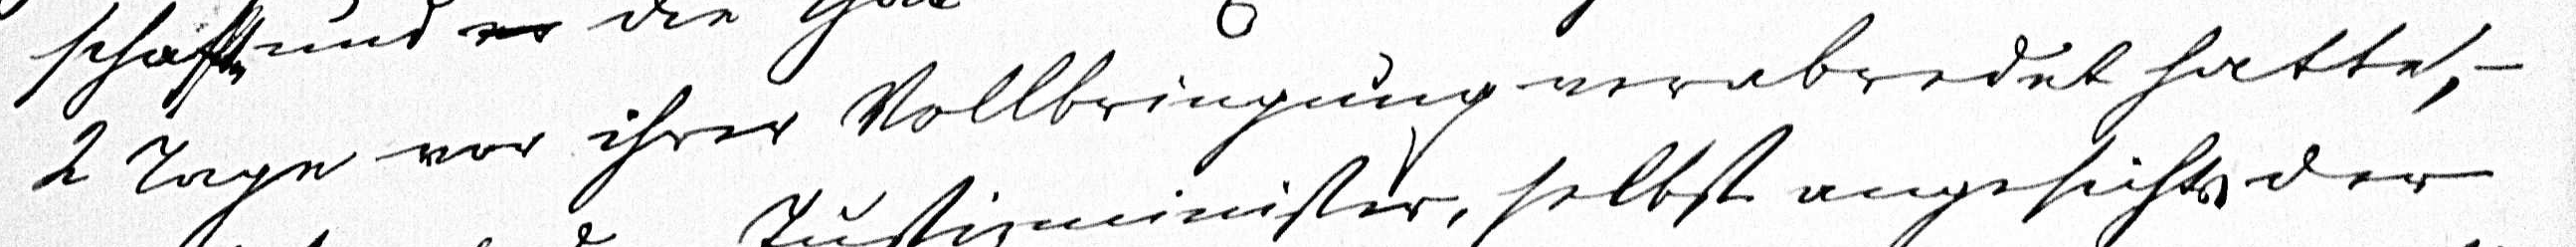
2 Tage vor ihrer Vollbringung verabredet hatte,-
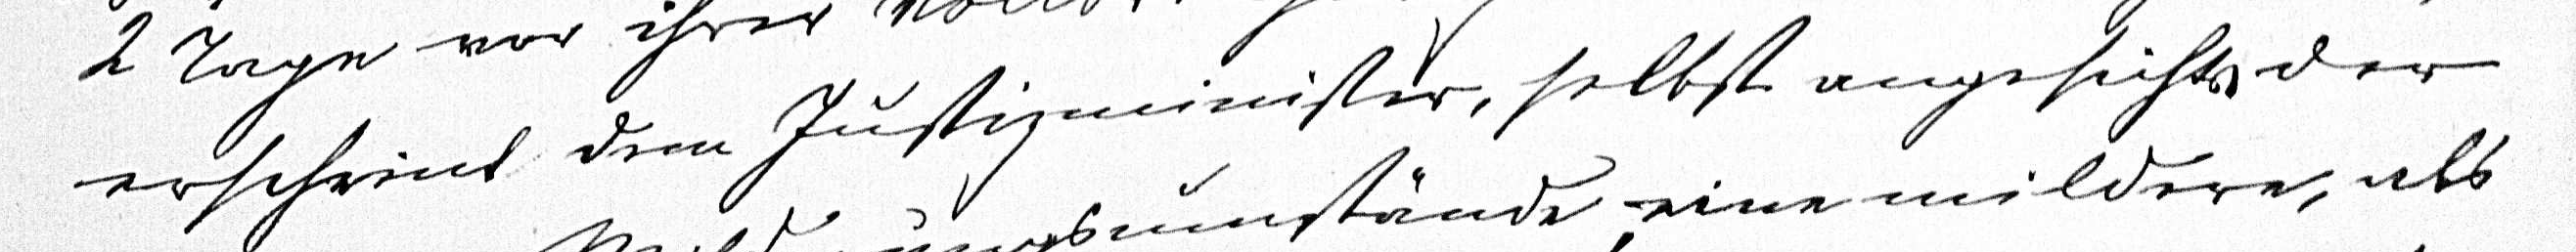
erscheint dem Justizminister, selbst angesichts der
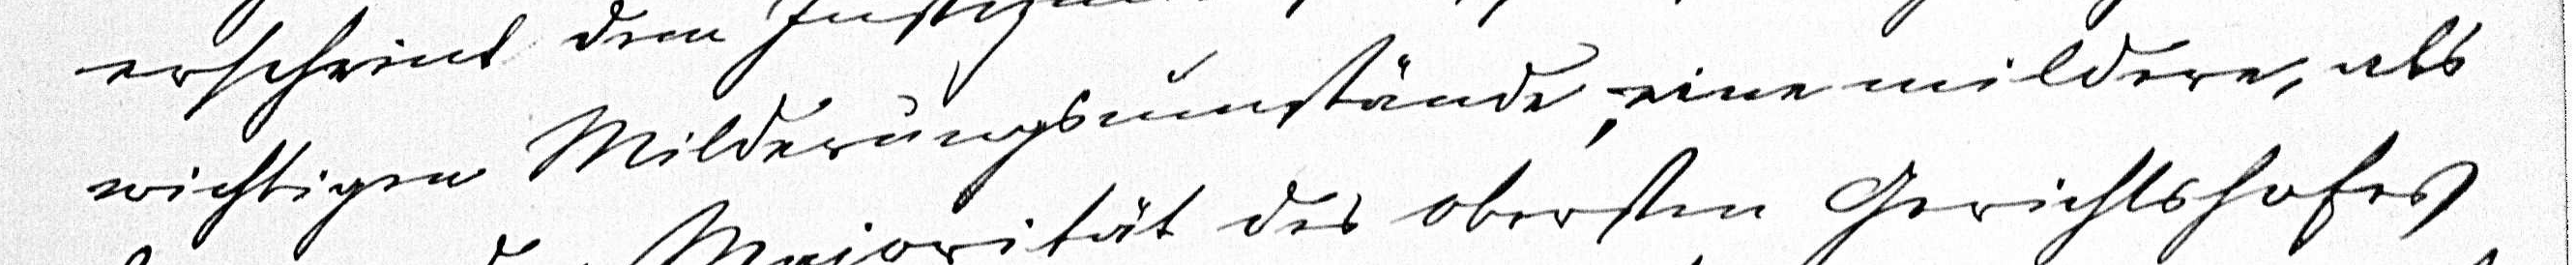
wichtigen Milderungsumstände, eine mildere, als
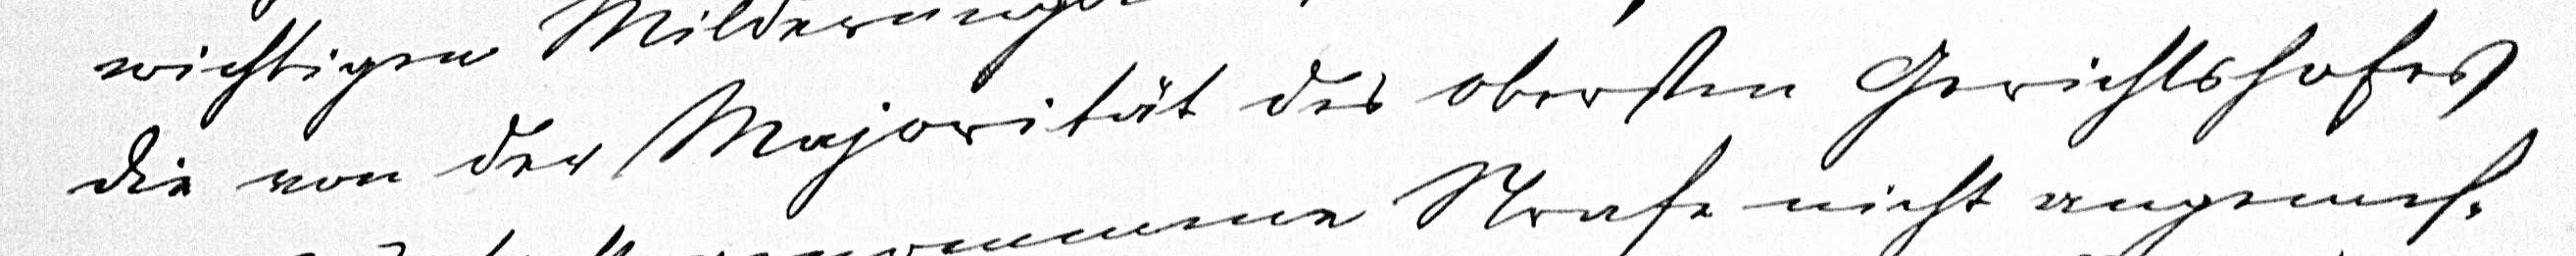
die von der Majorität des obersten Gerichtshofes
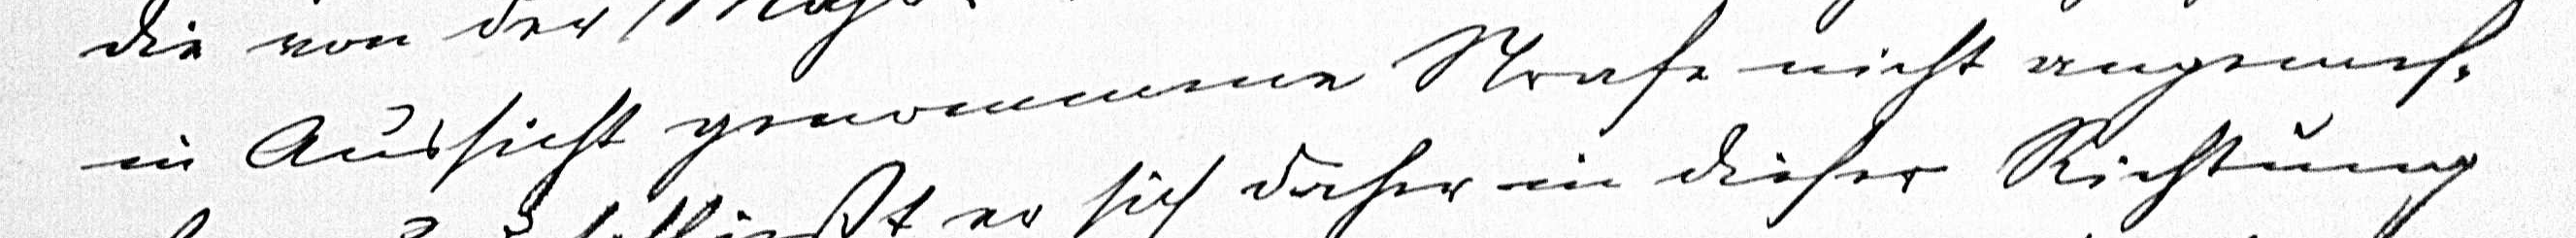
in Aussicht genommene Strafe nicht angemes¬
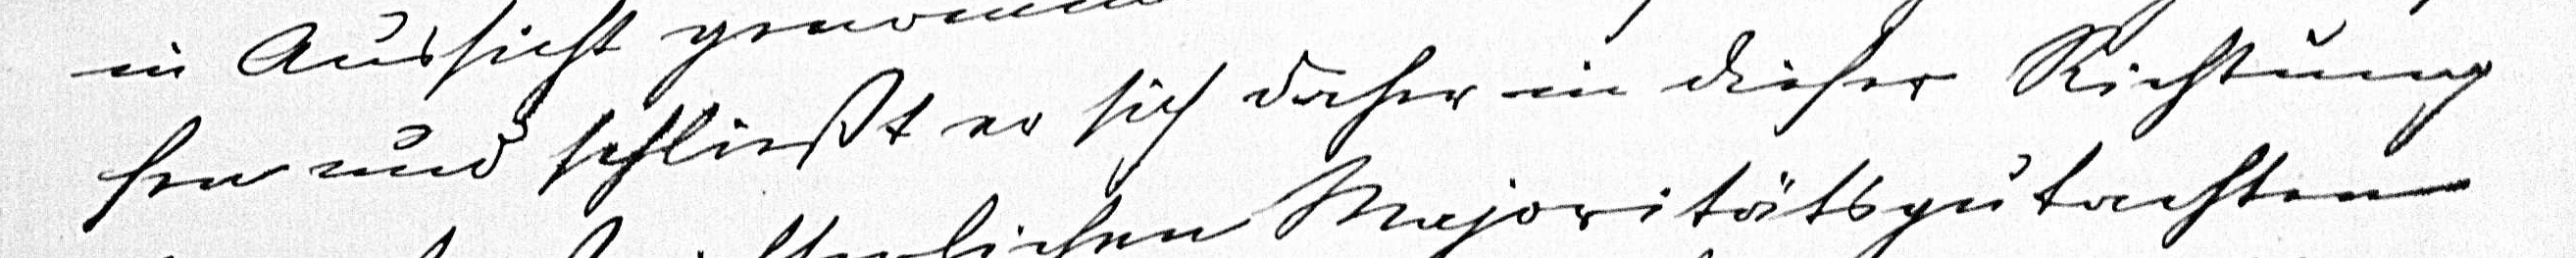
sen und schließt er sich daher in dieser Richtung
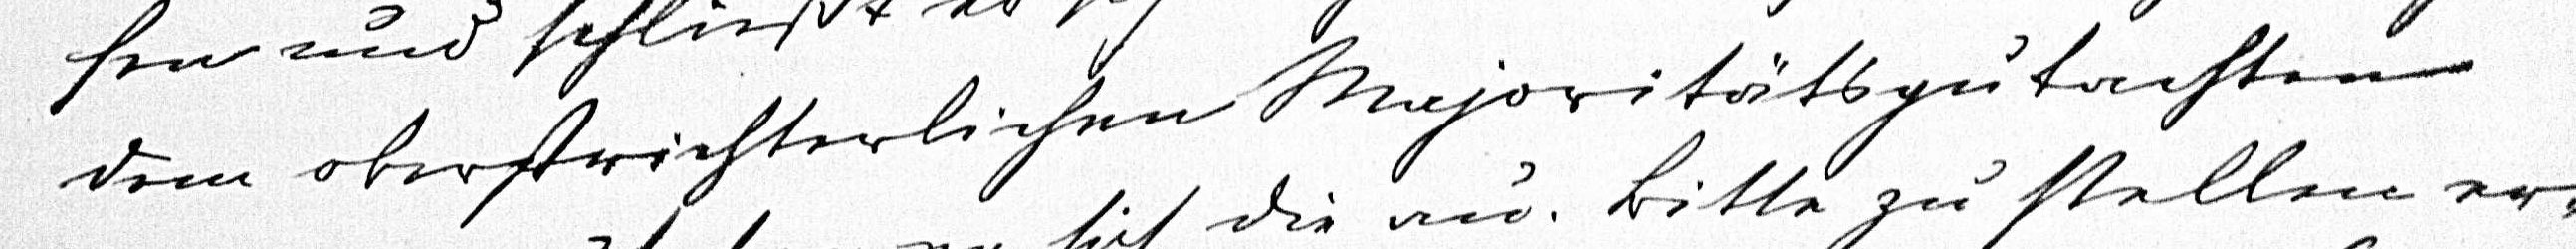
dem oberstrichterlichen Majoritätsgutachten
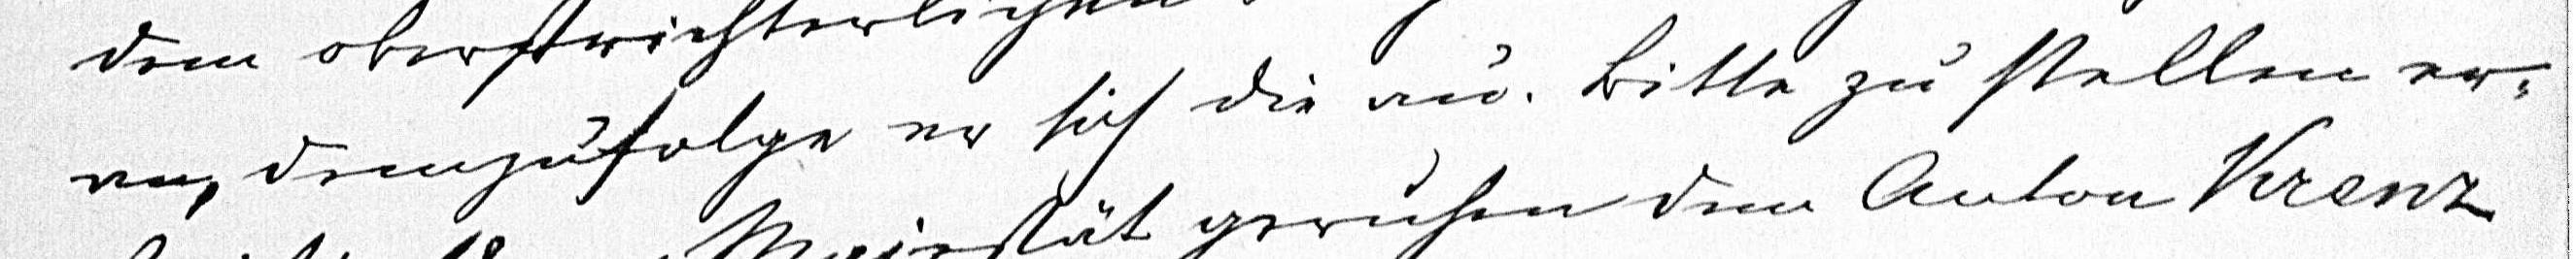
an, demzufolge er sich die au. Bitte zu stellen er¬
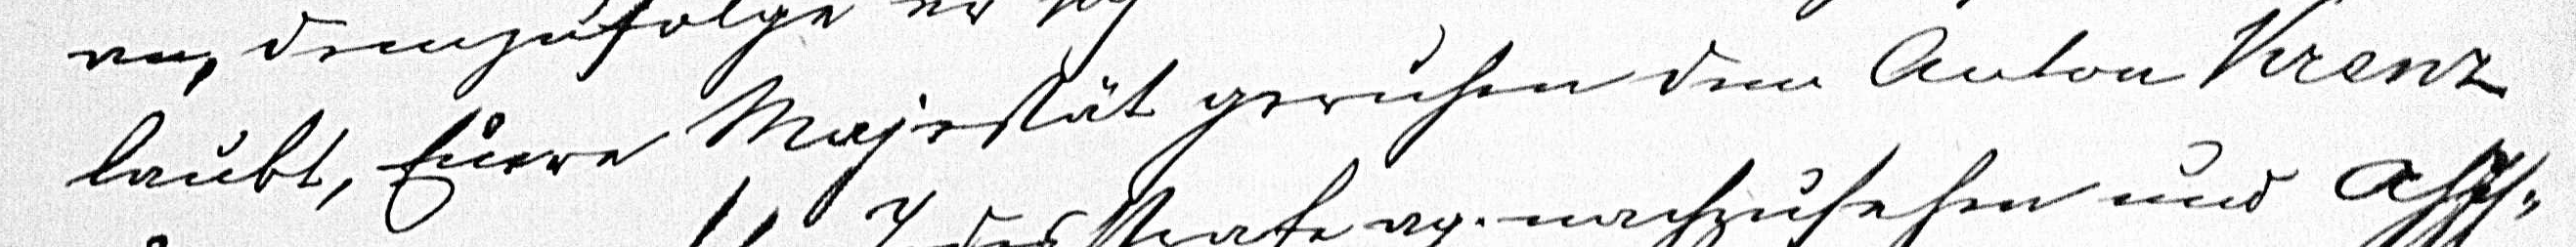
laubt, Euere Majestät geruhen dem Anton Krenz
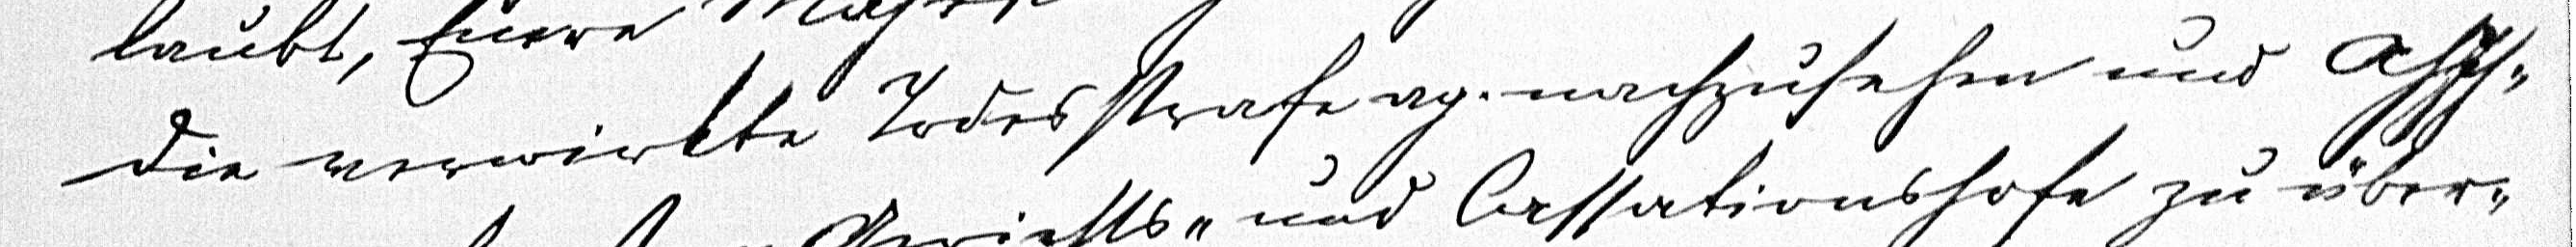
die verwirkte Todesstrafe ag. nachzusehen und Axx¬
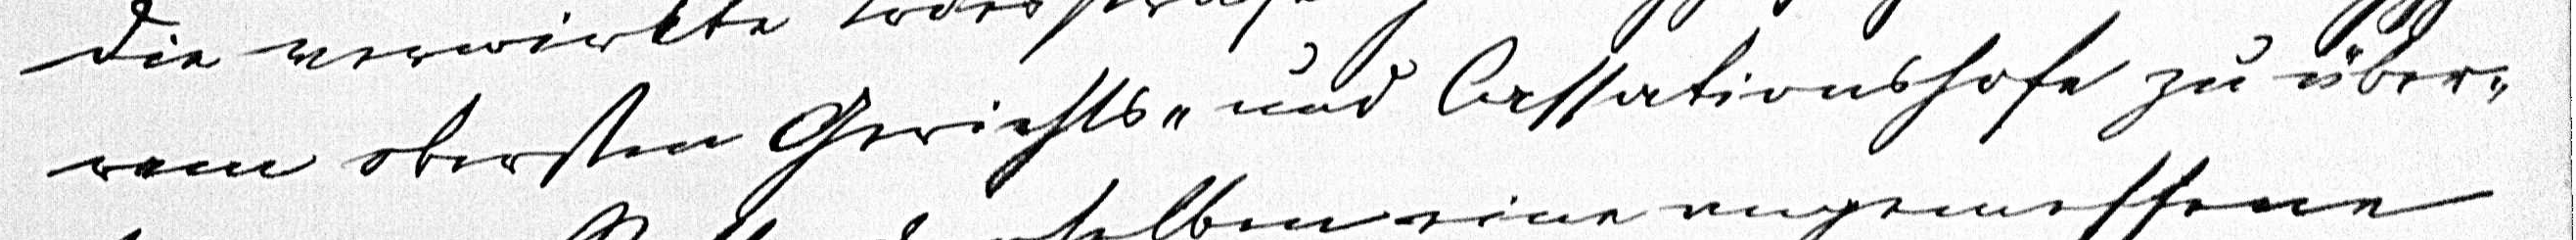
rem obersten Gerichts= und Cassationshofe zu über¬
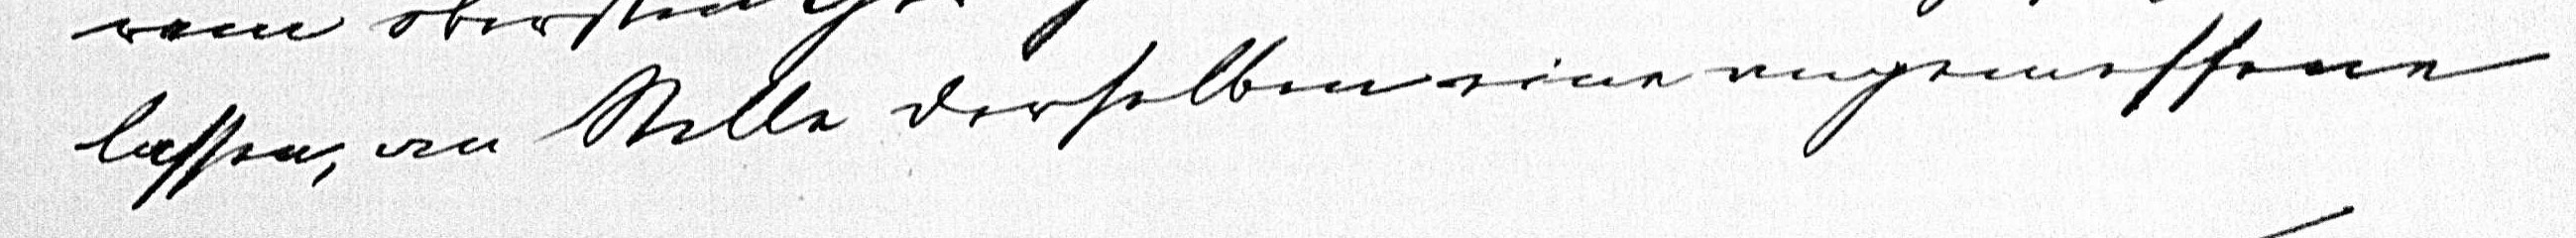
lassen, an Stelle derselben eine angemessene
